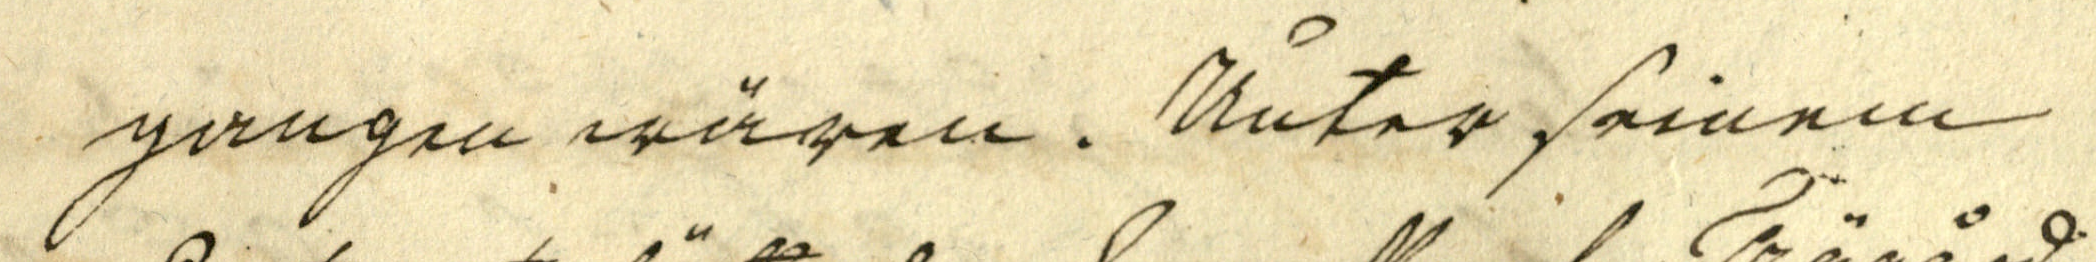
gangen wären. Unter seinem
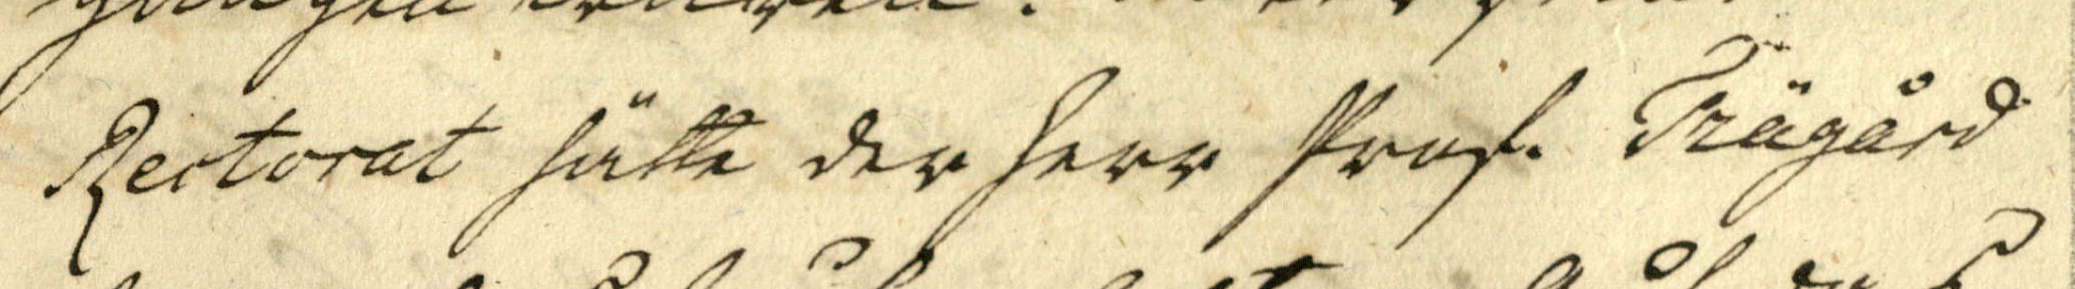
Rectorat hätte der Herr Prof. Trägård
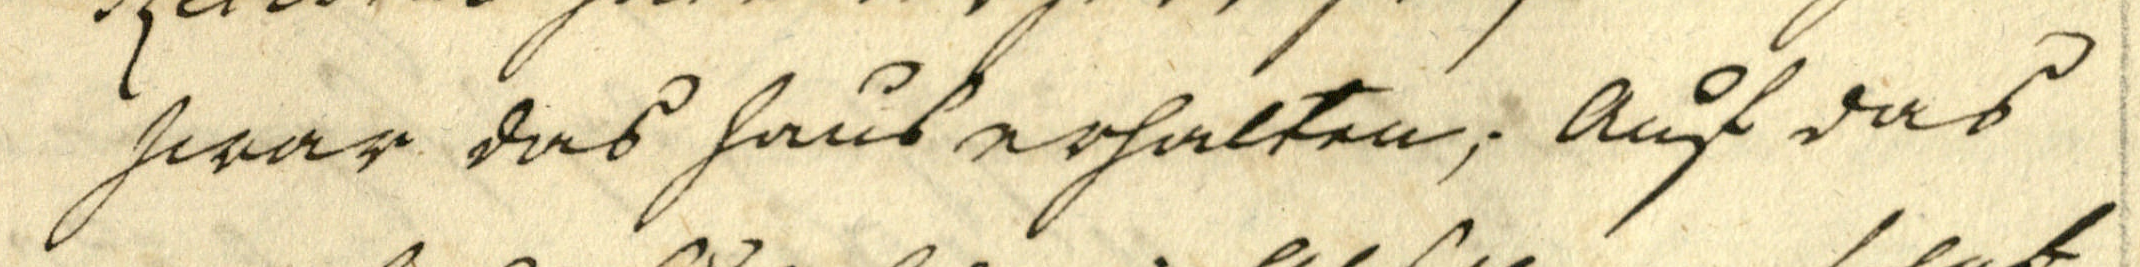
zwar das Haus erhalten; Auf das
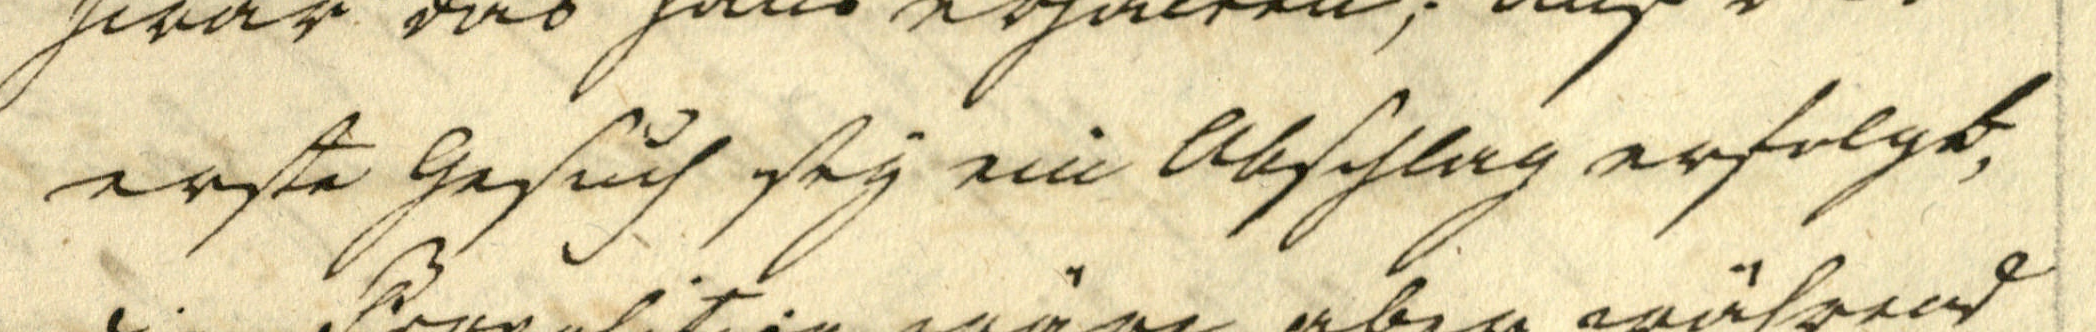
erste Gesuch sey ein Abschlag erfolgt,
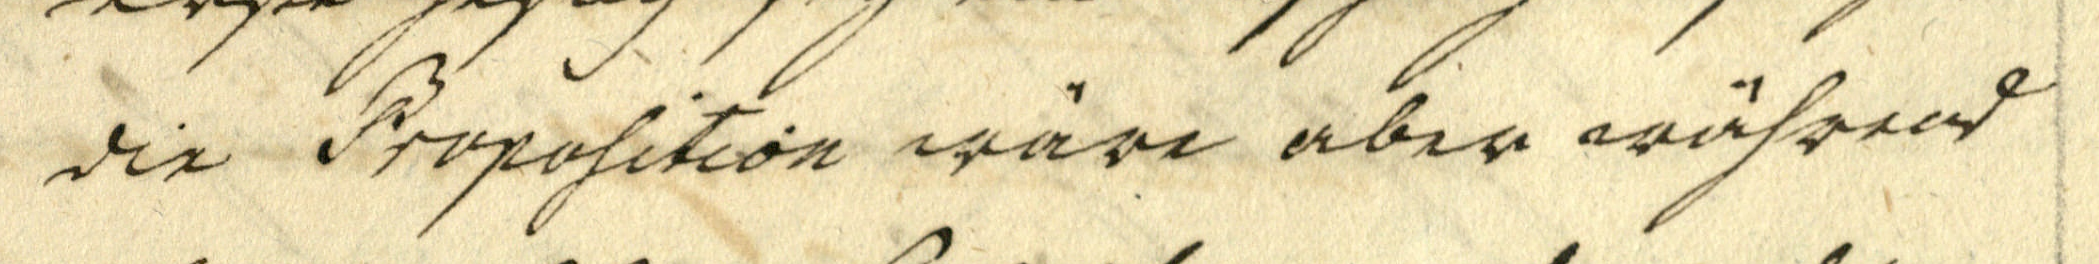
die Proposition wäre aber während
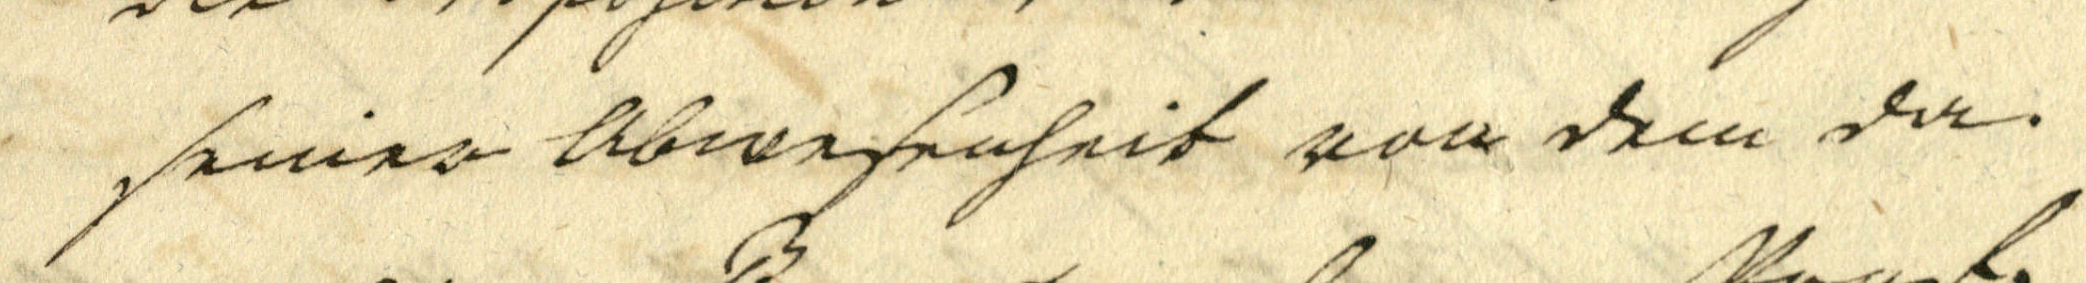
seiner Abwesenheit von dem da¬
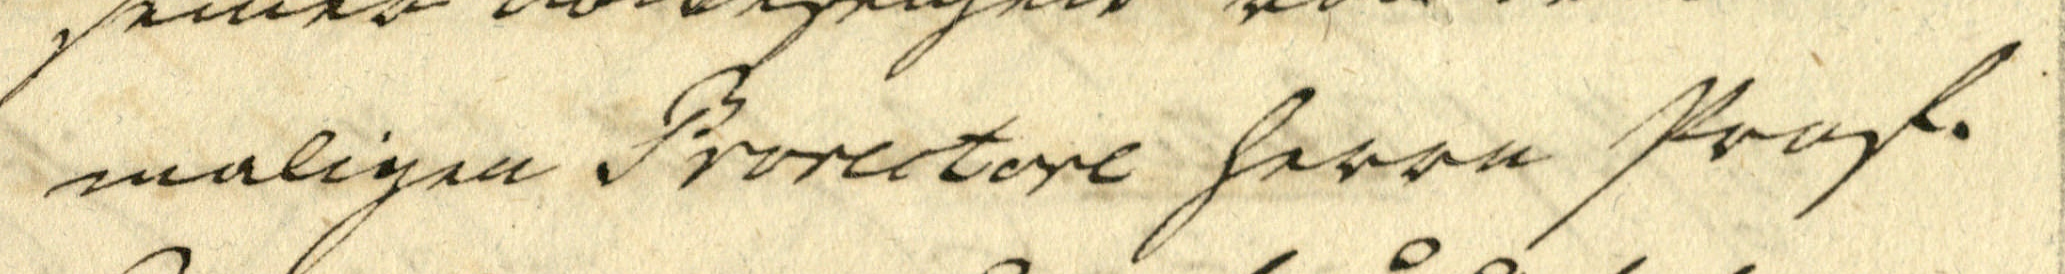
maligen Prorectore Herrn Prof.
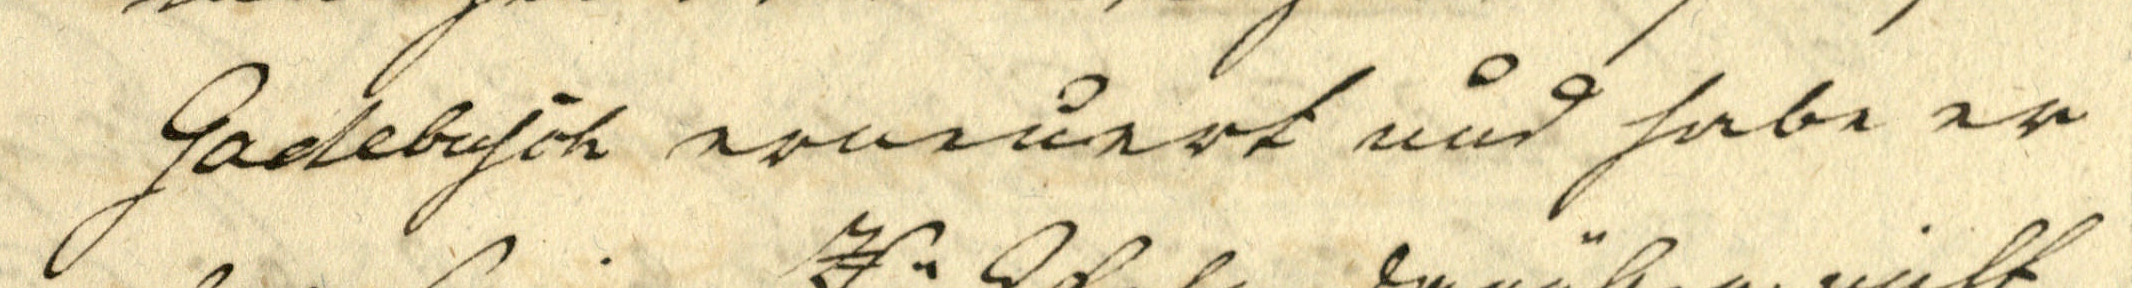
Gadebusch erneuert und habe er
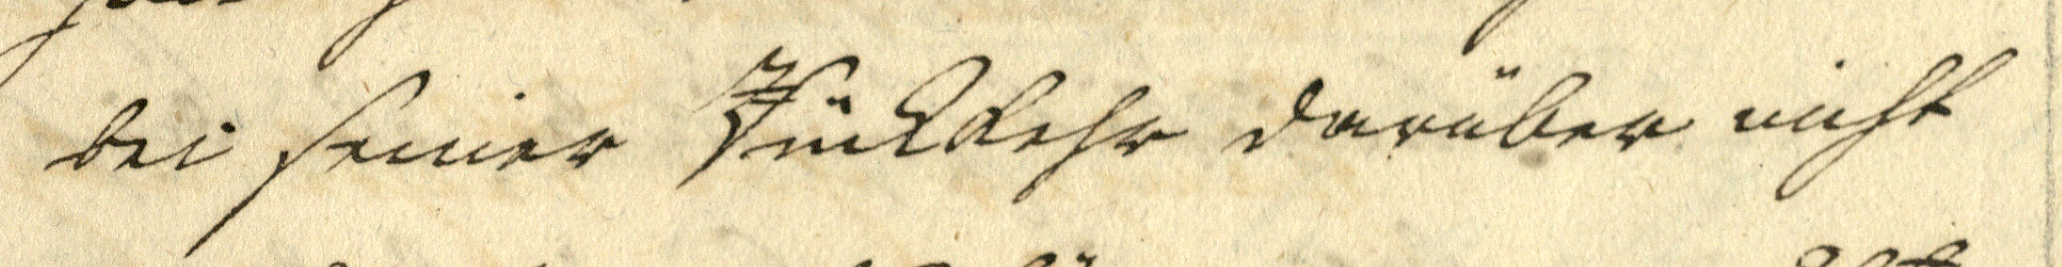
bei seiner Rückkehr darüber nicht
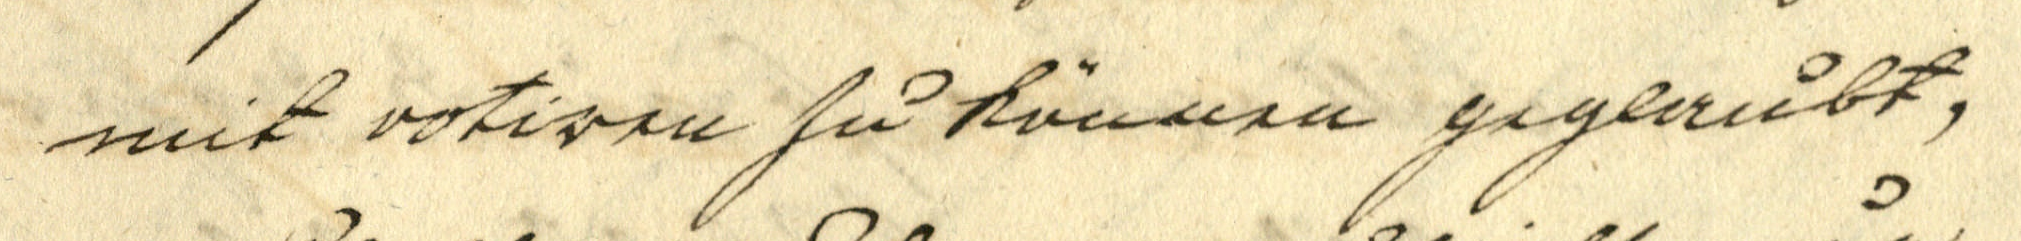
mit votiren zu können geglaubt,
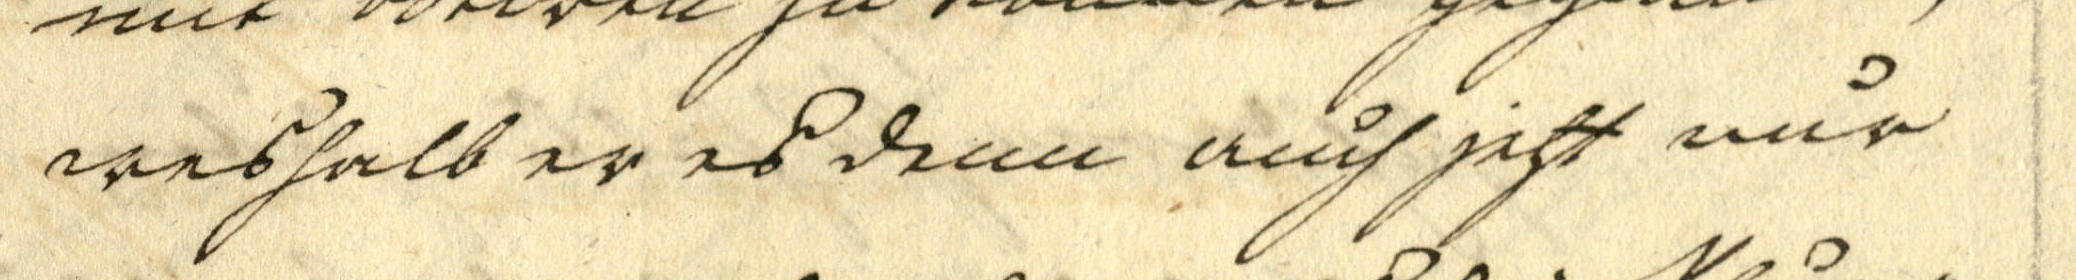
weshalb er es denn auch jetzt nur
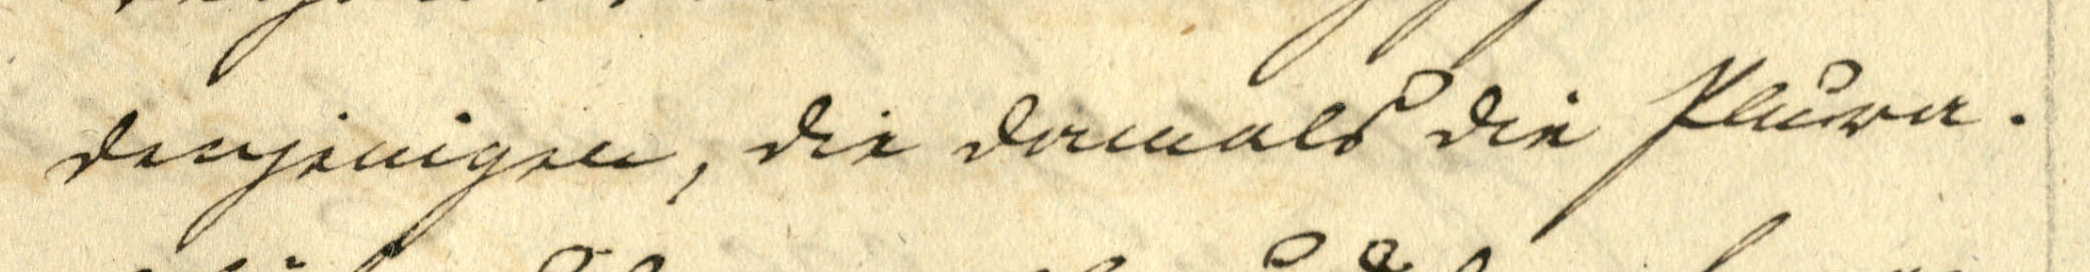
denjenigen, die damahls die Plura¬
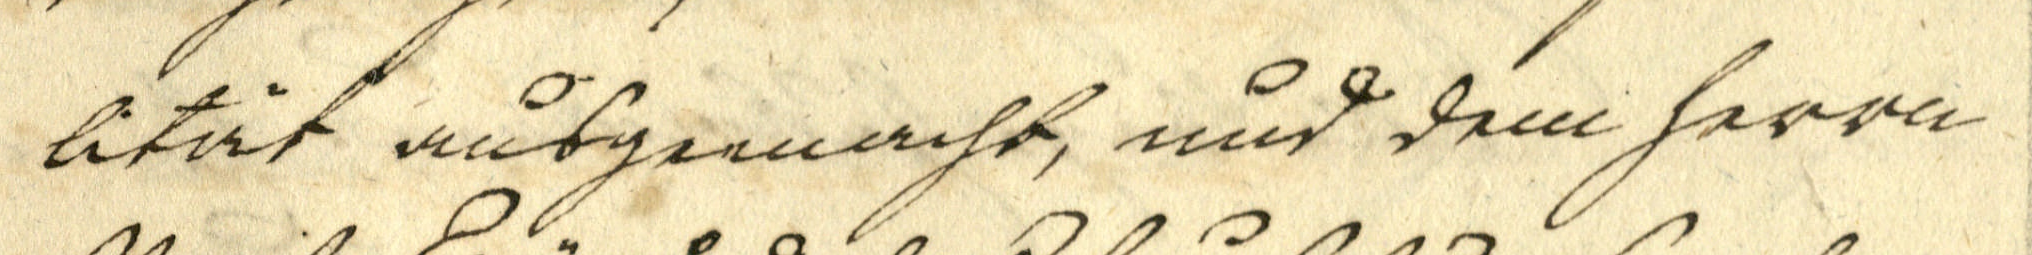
lität ausgemacht, und dem Herrn
